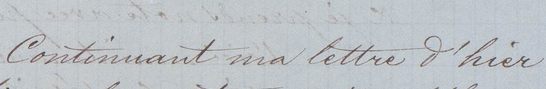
Continuant ma lettre d'hier
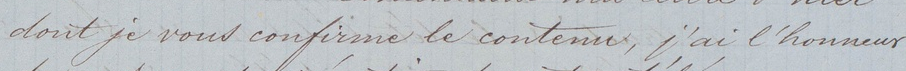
dont je vous confirme le contenu, j'ai l'honneur
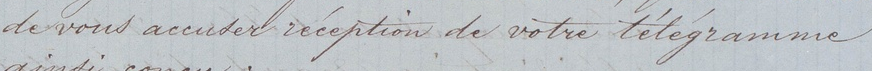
de vous accuser réception de votre télégramme
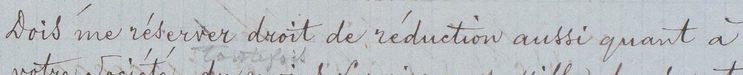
«Dois me réserver droit de réduction aussi quant à
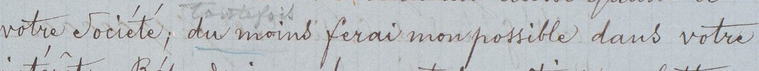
votre Société; du moins ferai mon possible dans votre
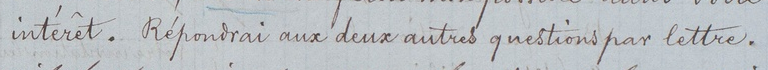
intérêt. Répondrai aux deux autres questions par lettre.»
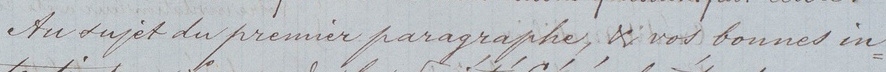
Au sujet du premier paragraphe, & vos bonnes in-
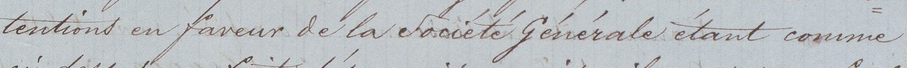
tentions en faveur de la Société Générale étant comme
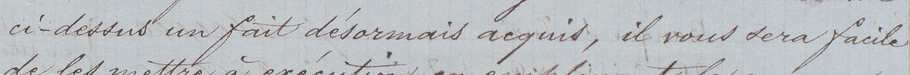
ci-dessus un fait désormais acquis, il vous sera facile
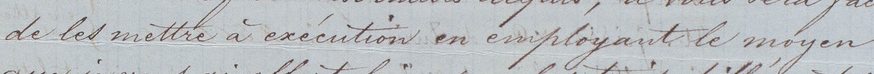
de les mettre à exécution en employant le moyen
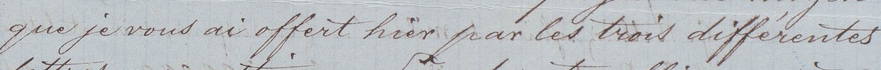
que je vous ai offert hier par les trois différentes
